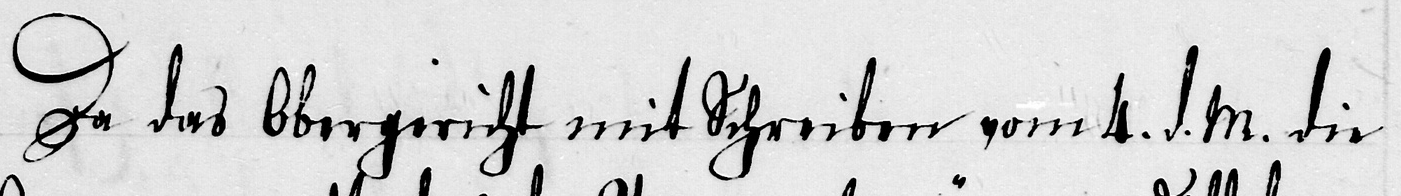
Da das Obergericht mit Schreiben vom 4. d. M. die
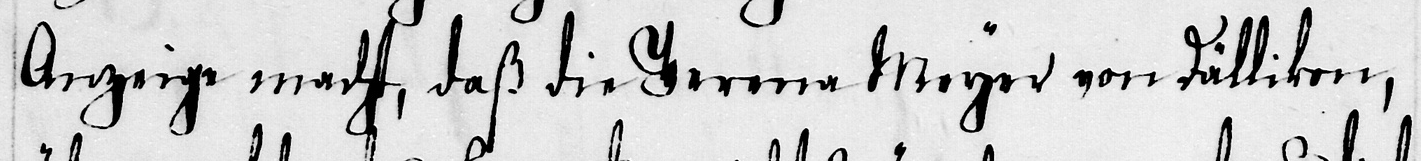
Anzeige macht, daß die Verena Meyer von Dällikon,
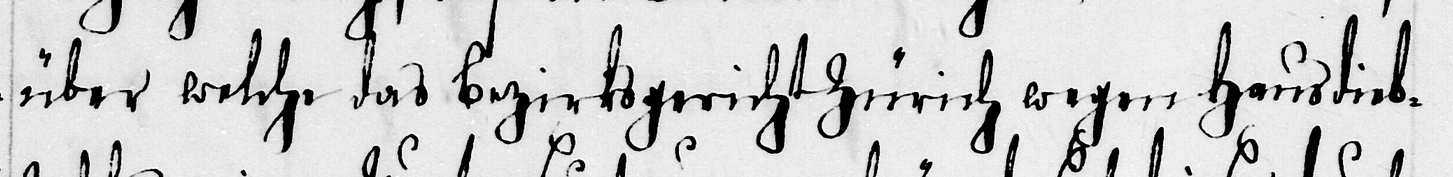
über welche das Bezirksgericht Zürich wegen Hausdieb¬
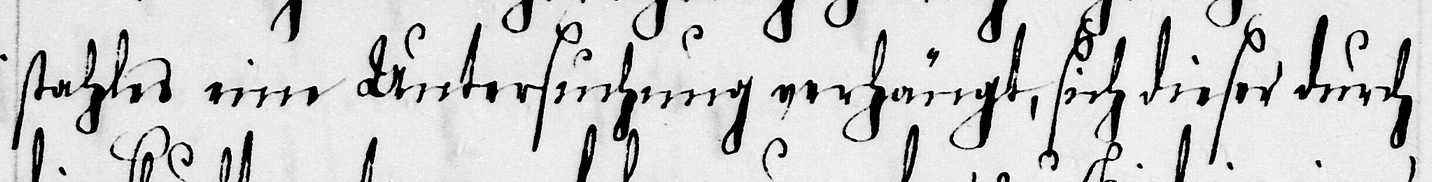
stahles eine Untersuchung verhängt, sich dieser durch
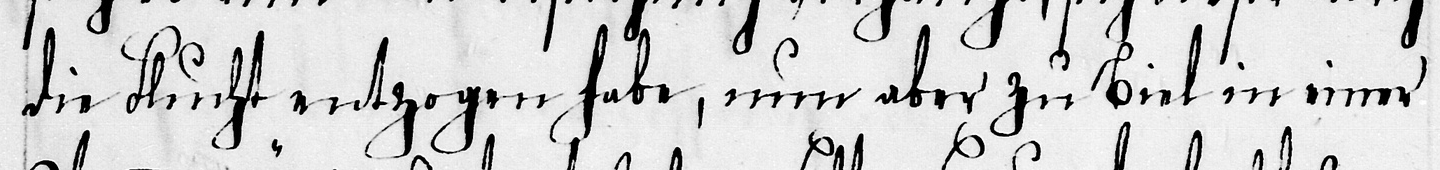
die Flucht entzogen habe, nun aber zu Biel in einer
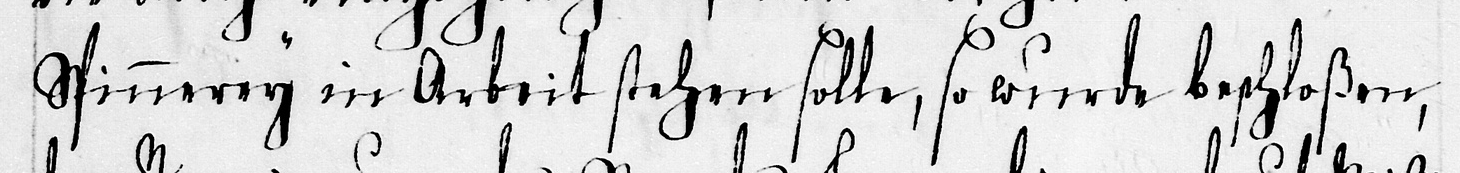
Spinnerey in Arbeit stehen solle, so wurde beschloßen,
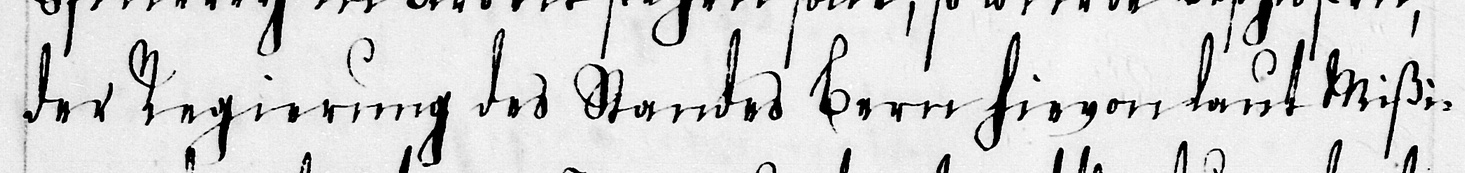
der Regierung des Standes Bern hievon laut Mißi¬
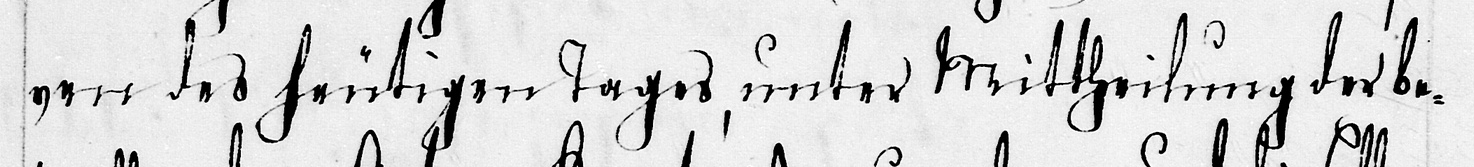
ven des heutigen Tages, unter Mittheilung der be¬
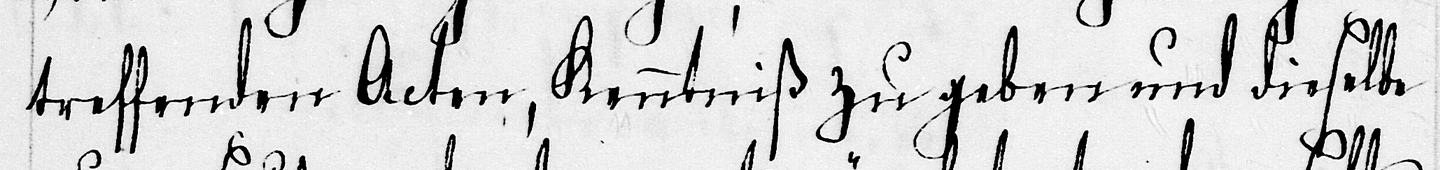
treffenden Acten, Kenntniß zu geben und dieselbe
